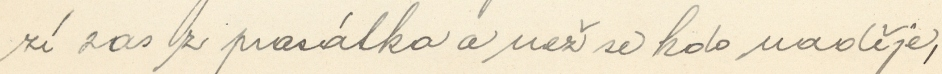zí zas z prasátka a než se kdo naděje,
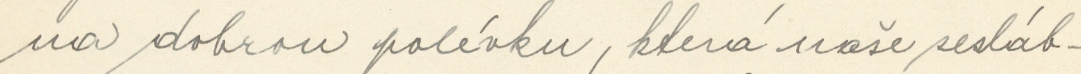na dobrou polévku, která naše sesláb-
